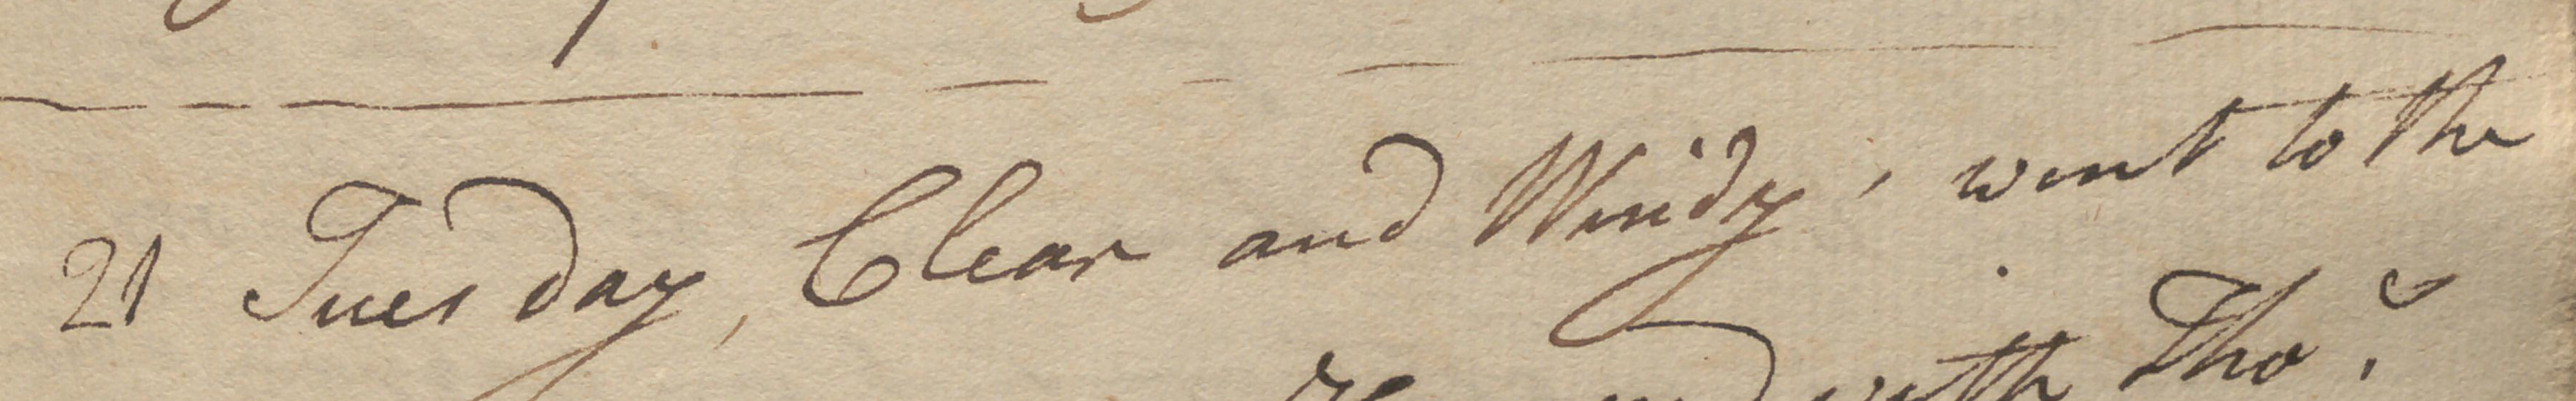21 Tuesday Clear and Windy, went to the
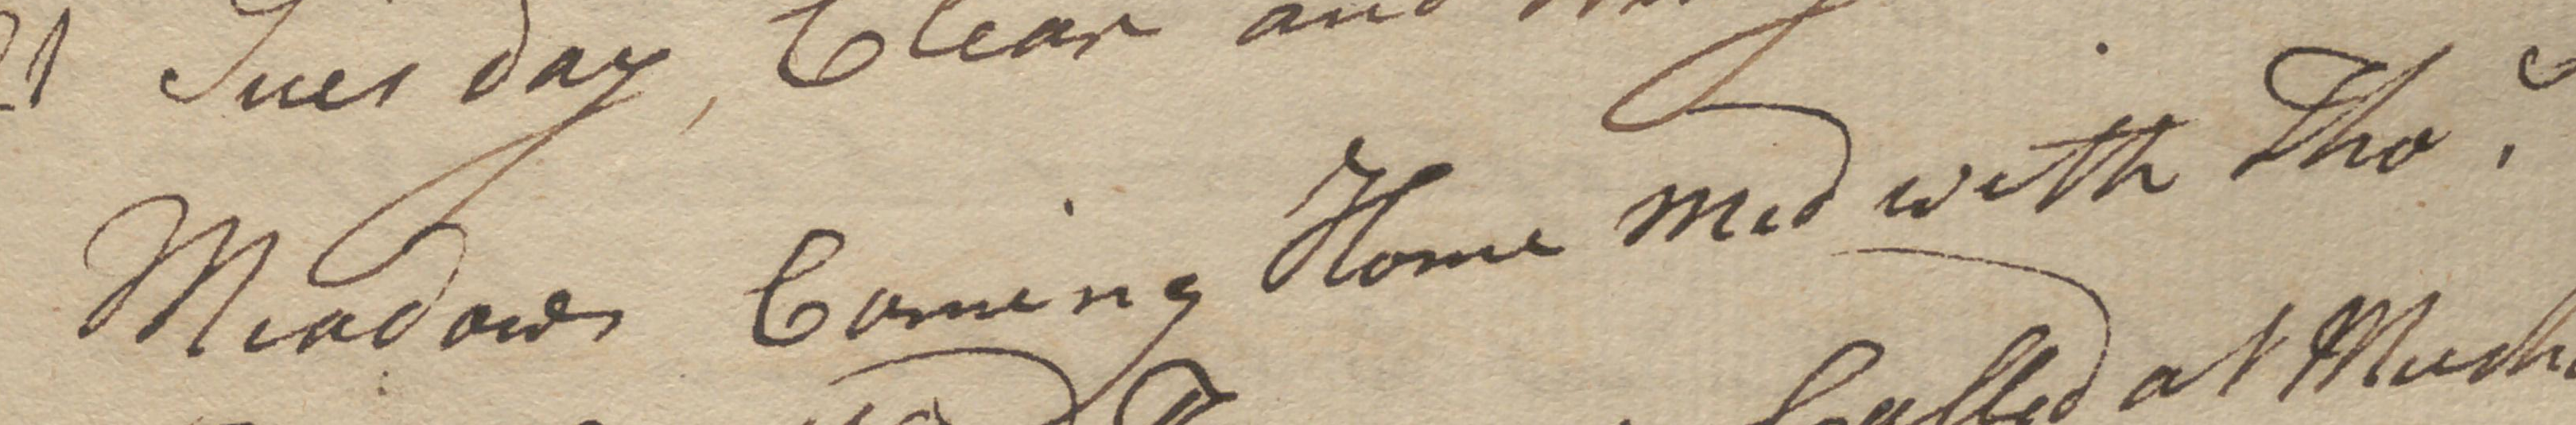Meadaw Coming Home med with Tho^s.
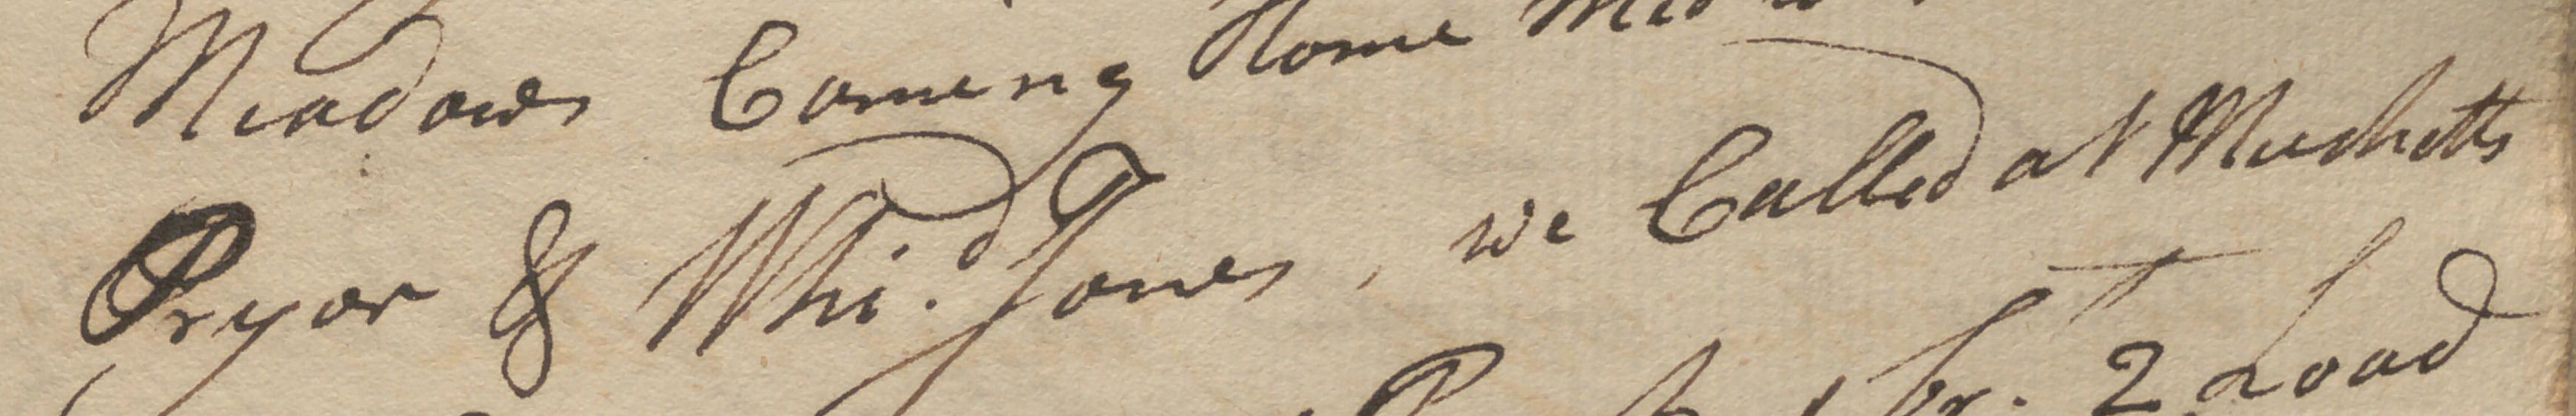Pryor & Whi^d. Jones, we Called at Mushetts
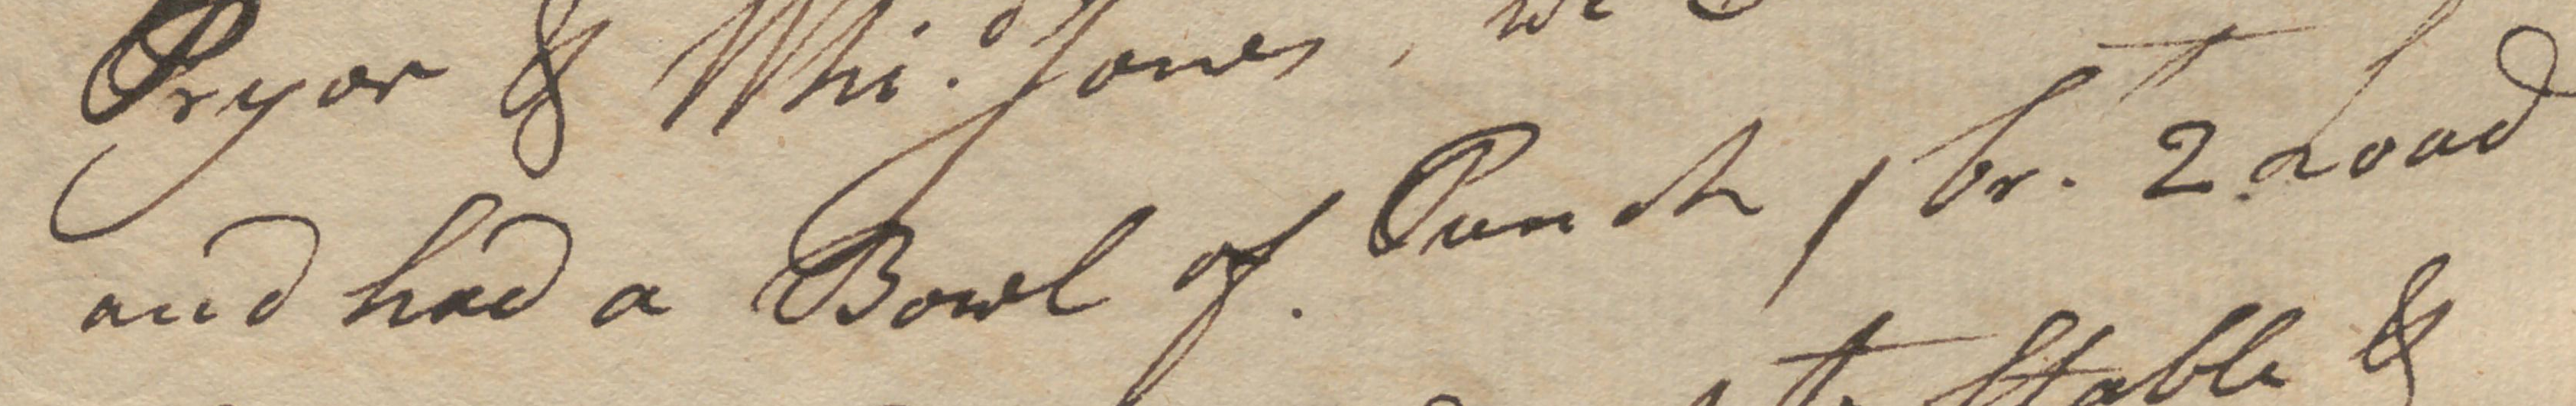and had a Bowl of Punch, br^t. 2 Load
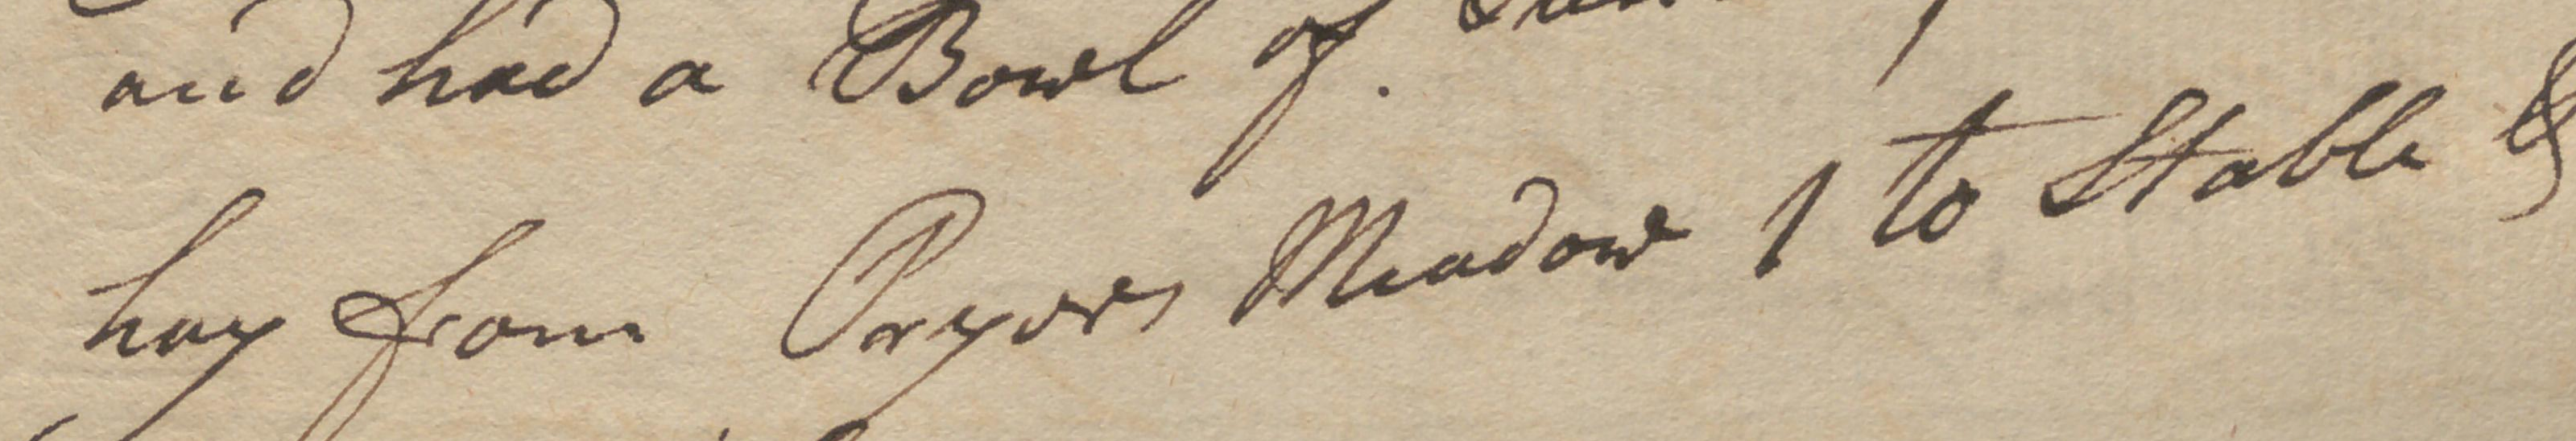hay from Pryors Meadow 1 to Stable &
